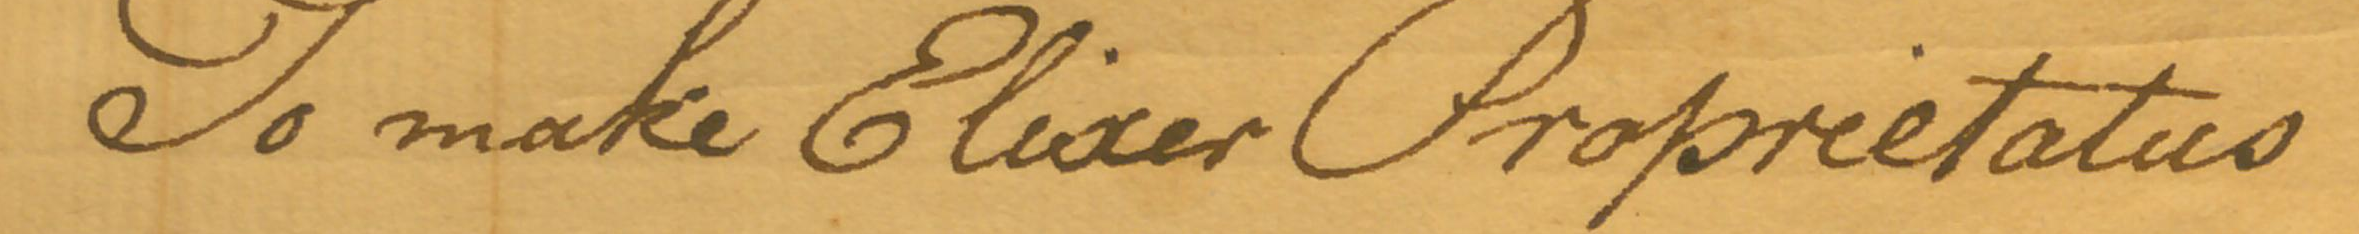To make Elixer Proprietatus
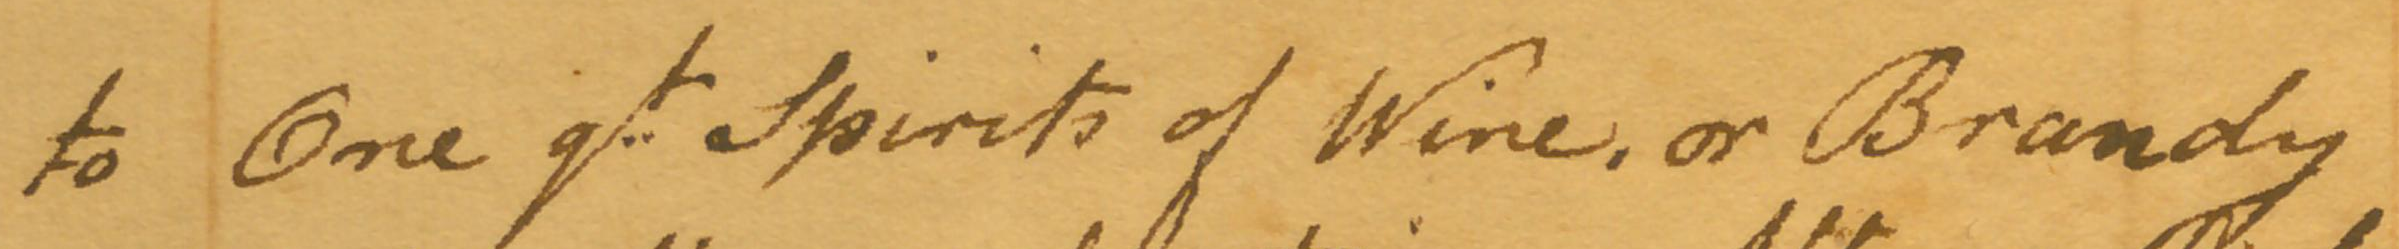to One q^t. Spirits of Wine, or Brandy
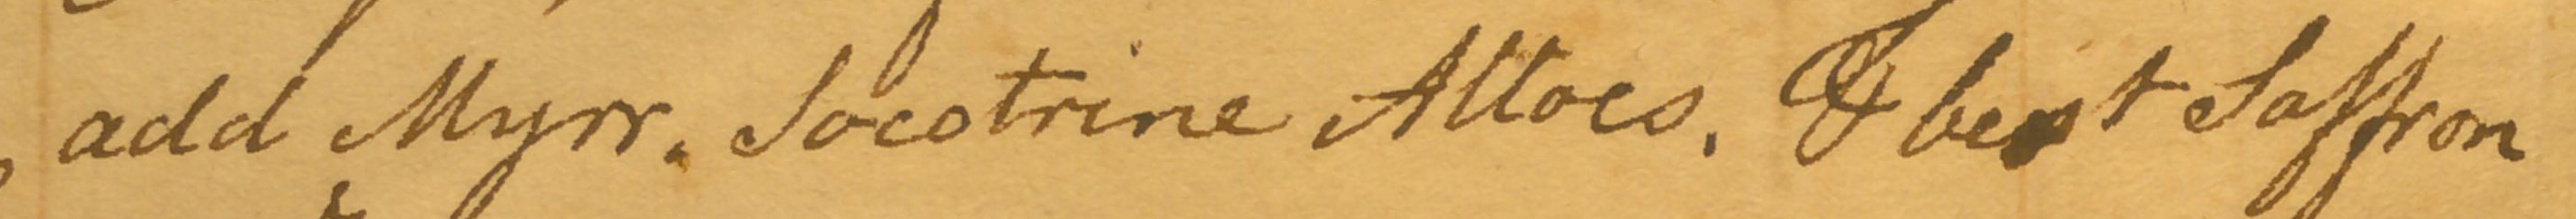add Myrr, socotrine Alloes, & best Saffron
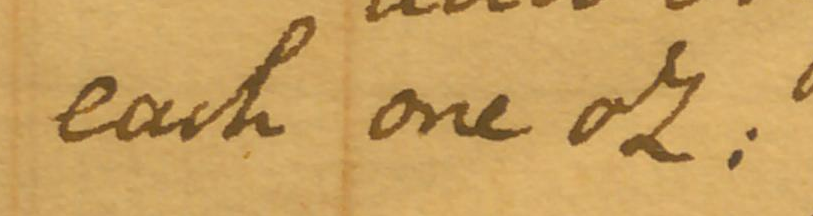each one oz:
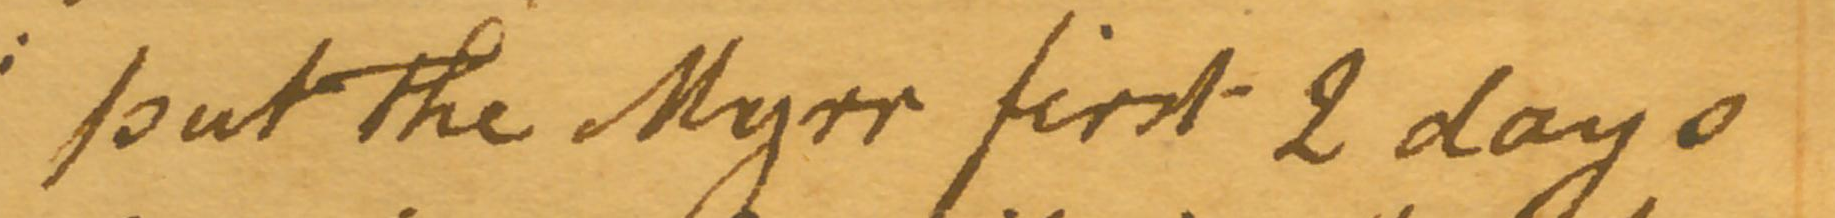put the Myrr first 2 days
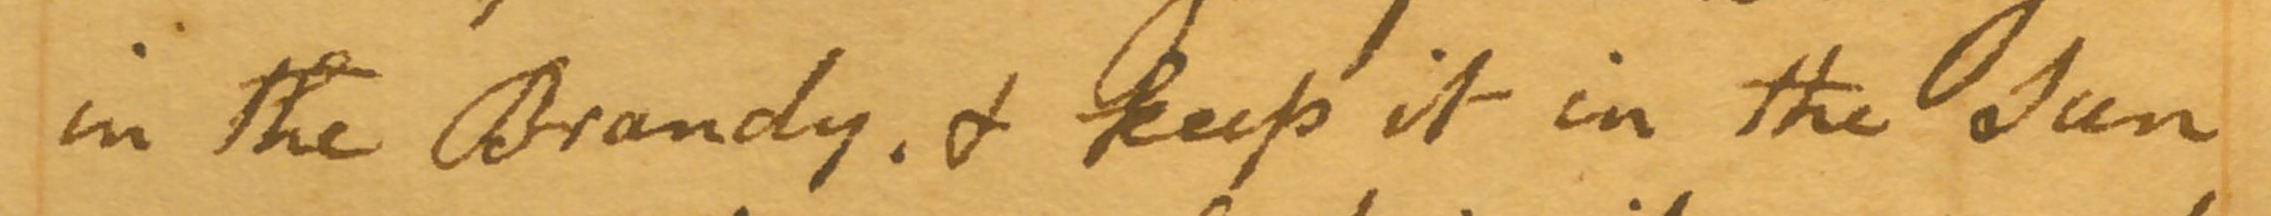in the Brandy, & keep it in the sun
